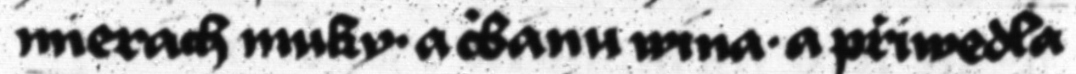mierách muky. a ċbánu wína. a pṙiwedla
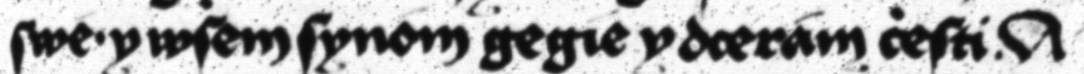ſwé. y wẛem ſynóm gegíe y dcerám ċeſti. A
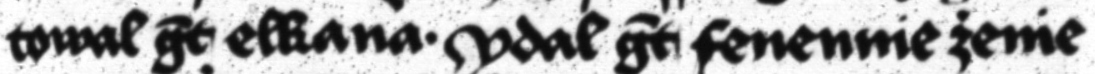towal ḡt elkana. Ydal ḡt fenennie żenie
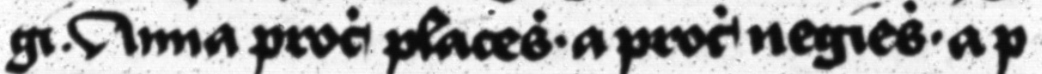íg. Anna proċ pláċeṡ. a proċ negíeṡ. a p
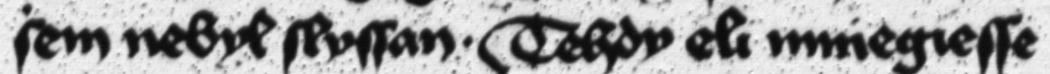ẛem nebyl ſlyſſán. Tehdy eli mniegíeſſe
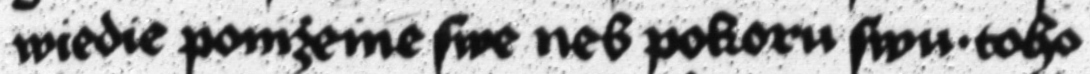wiedie poniżeṅíe ſwe neb pokoru ſwu. toho
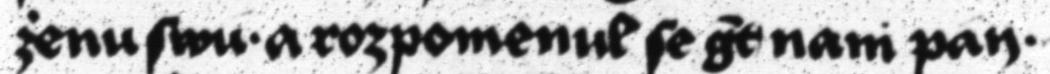żenu ſwú. a rozpomenul ſe ḡt nani pán.
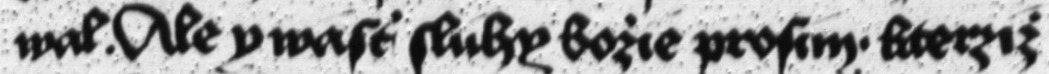wal. Ale y wáẛṫ ſlúhy bożíe proſím. kterzíż
